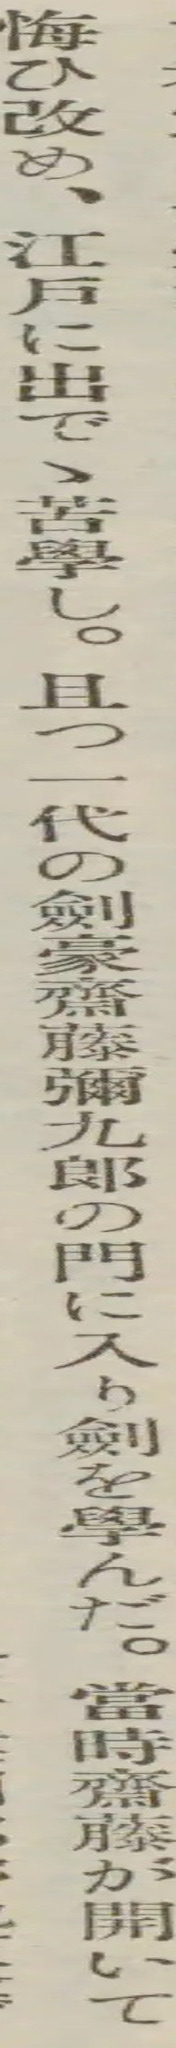悔ひ改め、江戸に出でゝ苦学し。且つ一代の剣豪齋藤彌九郎の門に入り剣を学んだ。当時齋藤が開いて
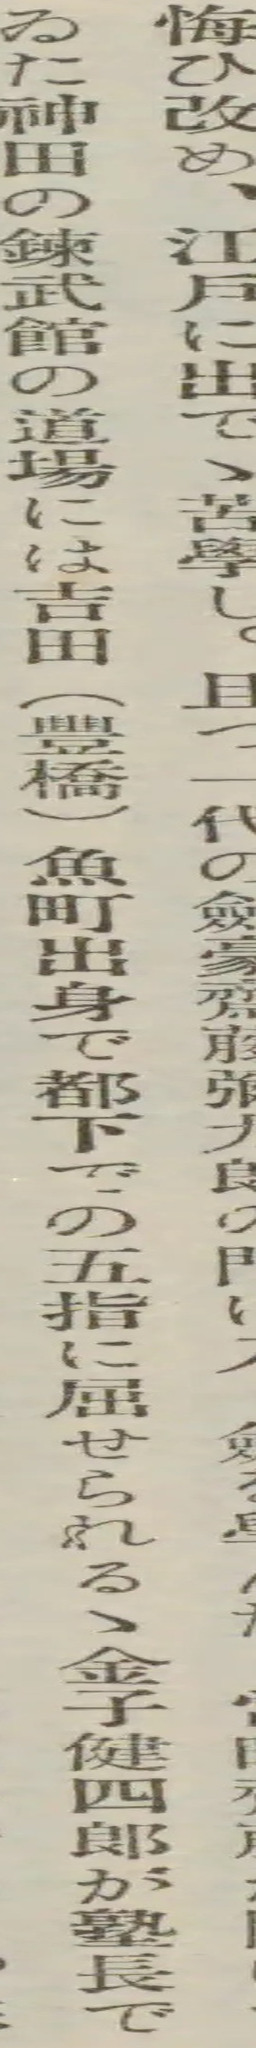ゐた神田の錬武館の道場には吉田(豊橋)魚町出身で都下での五指に屈せられるゝ金子健四郎が塾長で
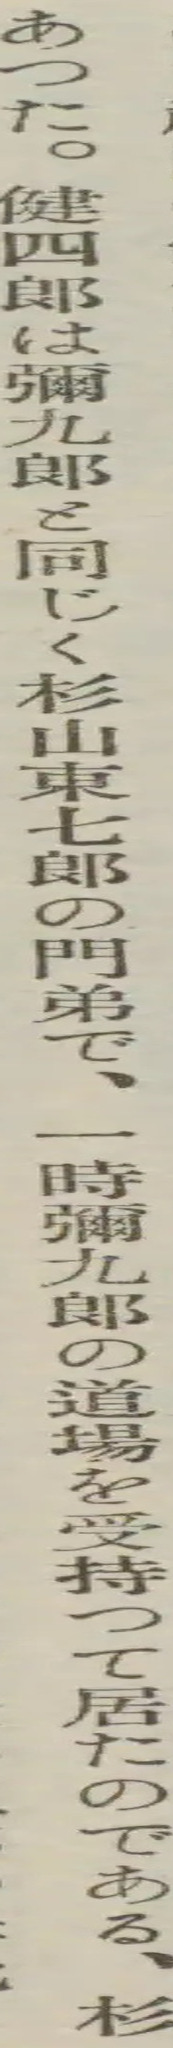あつた。健四郎は彌九郎と同じく杉山東七郎の門弟で、一時彌九郎の道場を受持つて居たのである、杉
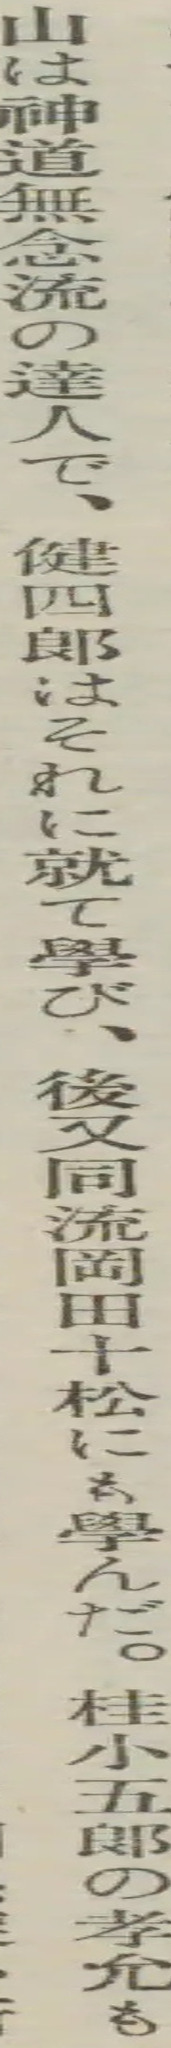山は神道無念流の達人で、健四郎はそれに就て学び、後又同流岡田十松にも学んだ。桂小五郎の孝允も
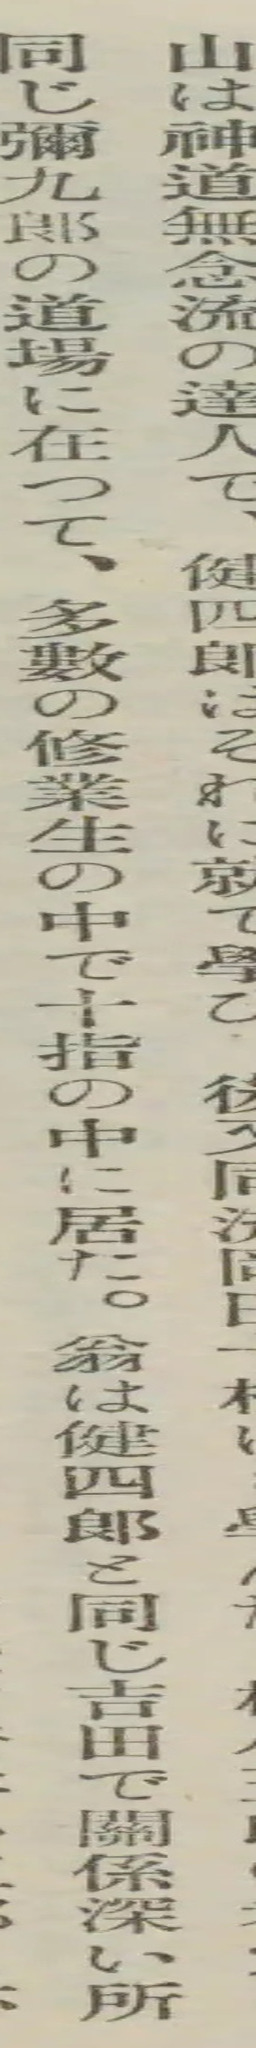同じ彌九郎の道場に在つて、多数の修業生の中で十指の中に居た。翁は健四郎と同じ吉田で関係深い所
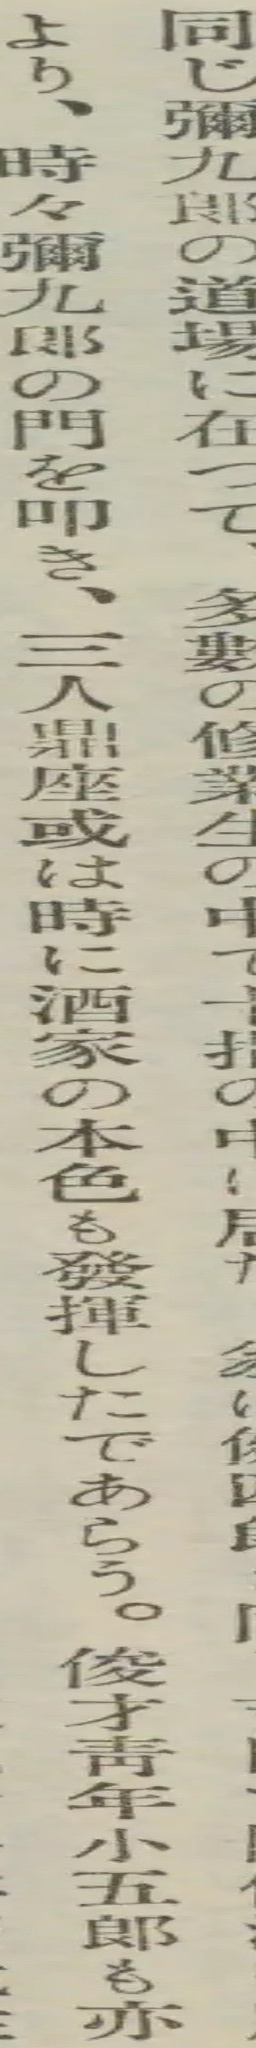より、時々彌九郎の門を叩き、三人鼎座或は時に酒家の本色も発揮したであらう。俊才青年小五郎も亦
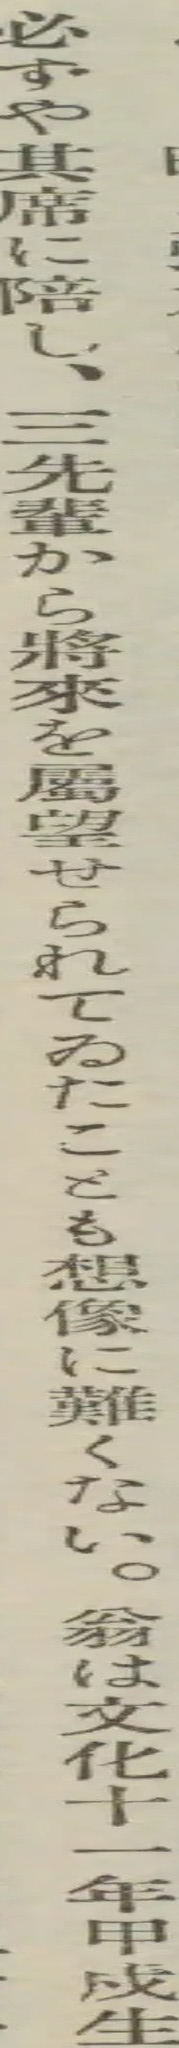必ずや其席に陪し、三先輩から将来を嘱望せられてゐたことも想像に難くない。翁は文化十一年甲戌生
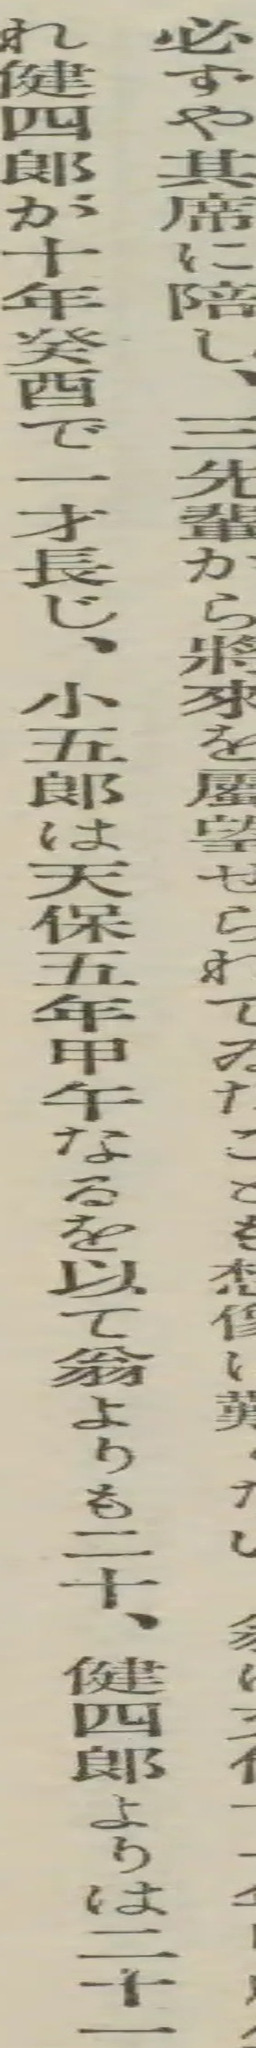れ健四郎が十年癸酉で一才長じ、小五郎は天保五年甲午なるを以て翁よりも二十、健四郎よりは二十一
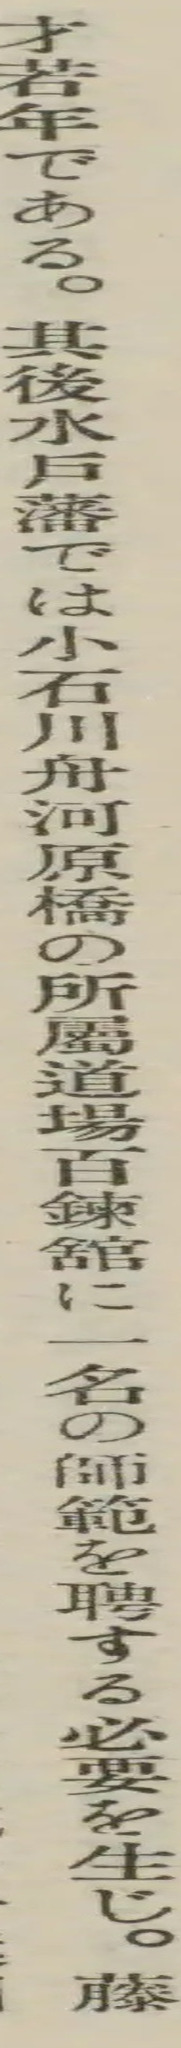才若年である。其後水戸藩では小石川舟河原橋の所属道場百錬館に一名の師範を聘する必要を生じ。藤
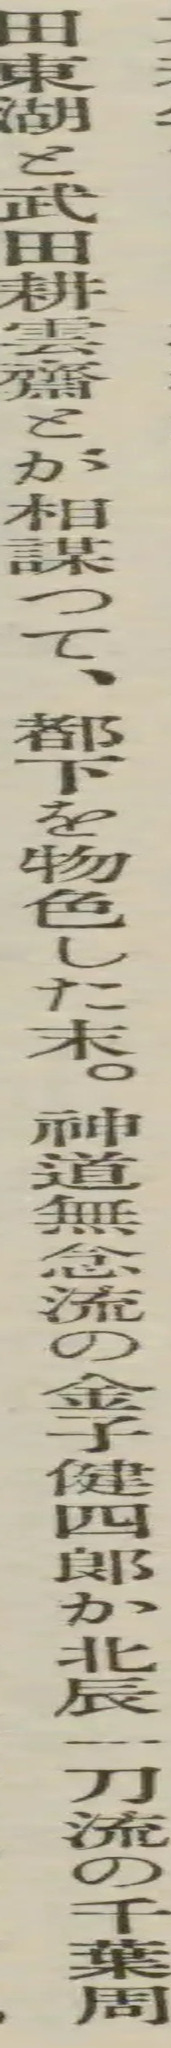田東湖と武田耕雲齋とが相謀つて、都下を物色した末。神道無念流の金子健四郎か北辰一刀流の千葉周
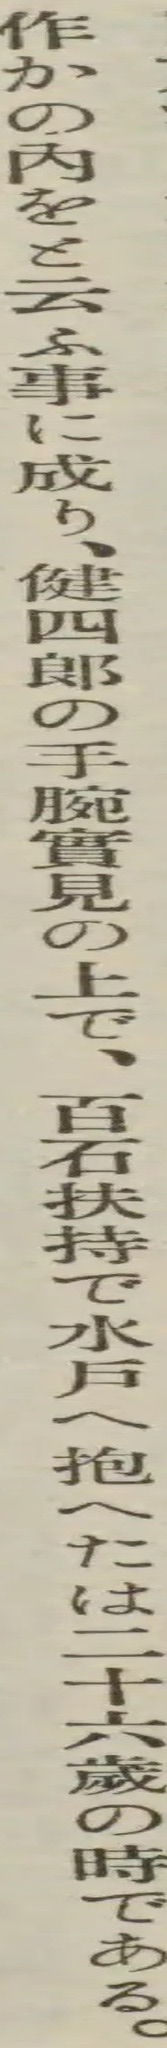作かの内をと云ふ事に成り、健四郎の手腕実見の上で、百石扶持で水戸へ抱へたは二十六歳の時である。
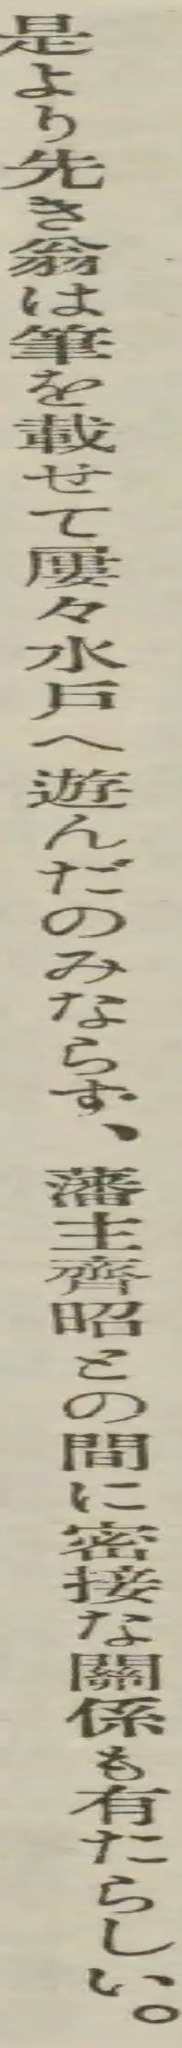是より先き翁は筆を載せて屡々水戸へ遊んだのみならず、藩主齊昭との間に密接な関係も有たらしい。
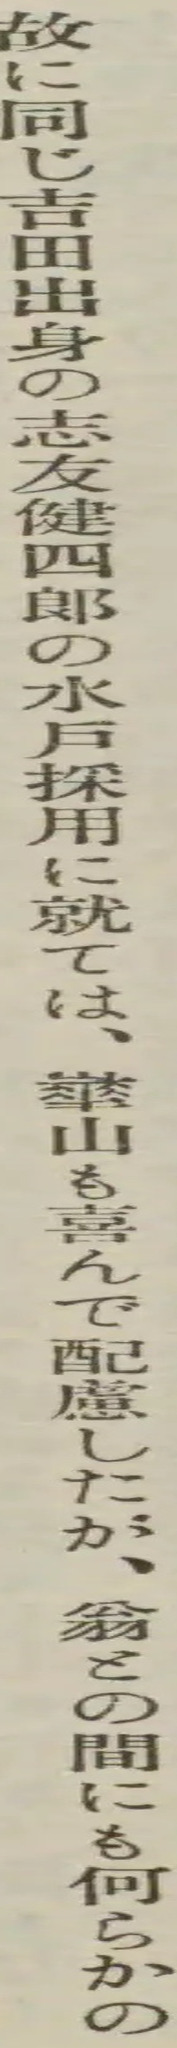故に同じ吉田出身の志友健四郎の水戸採用に就いては、華山も喜んで配慮したが、翁との間にも何らかの
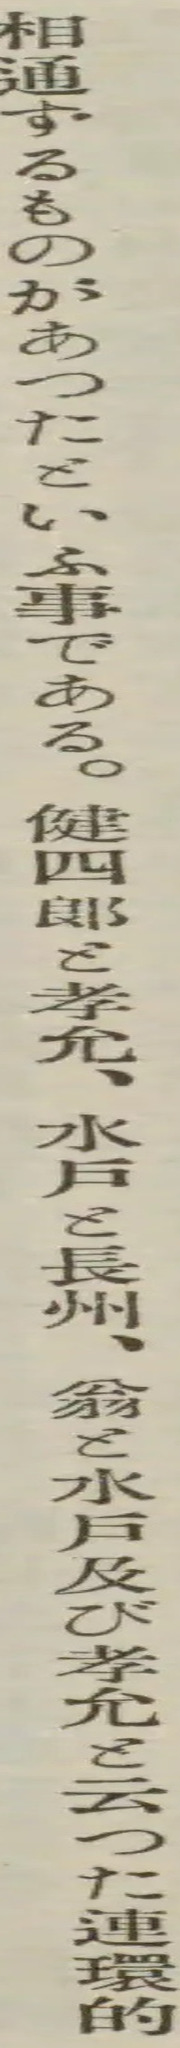相通ずるものがあつたといふ事である。健四郎と孝允、水戸と長州、翁と水戸及び孝允と云つた連環的
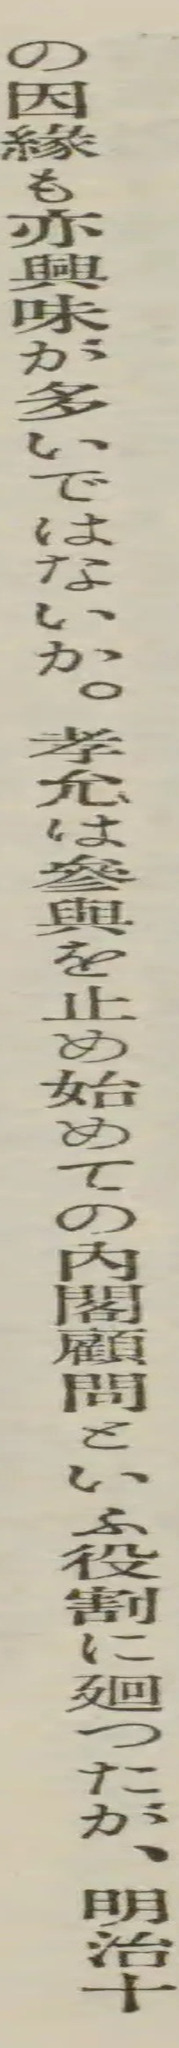の因縁も亦興味が多いではないか。孝允は参与を止め始めての内閣顧問といふ役割に廻つたが、明治十
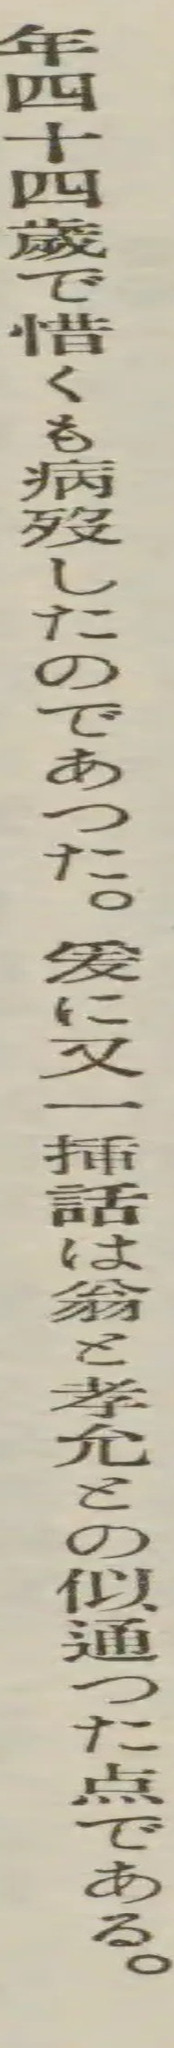年四十四歳で惜くも病没したのであつた。爰に又一挿話は翁と孝允との似通つた点である。
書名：小野湖山翁小伝
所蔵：国立国会図書館 National Diet Library, JAPAN
